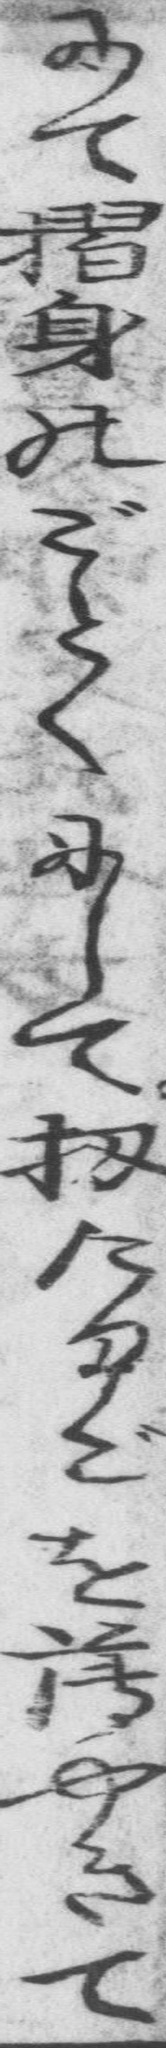にて。摺身のごとくにして。扨たまごを。薄やきて。
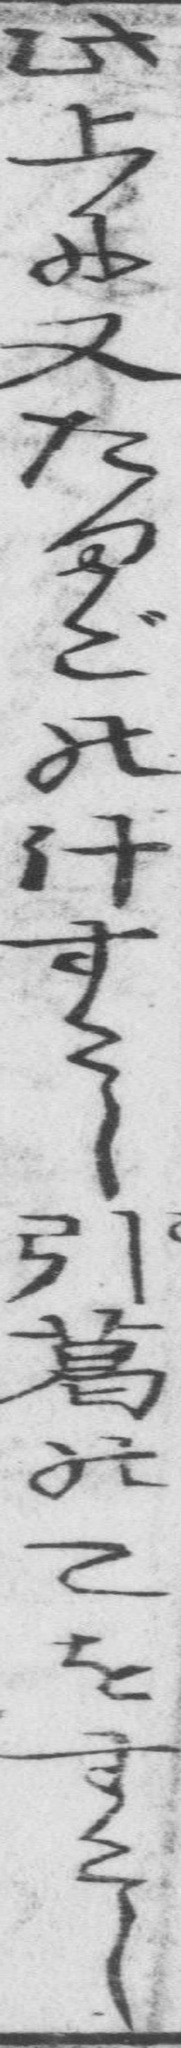此上に。又たまごの汁すこし引。葛のこを。すこし
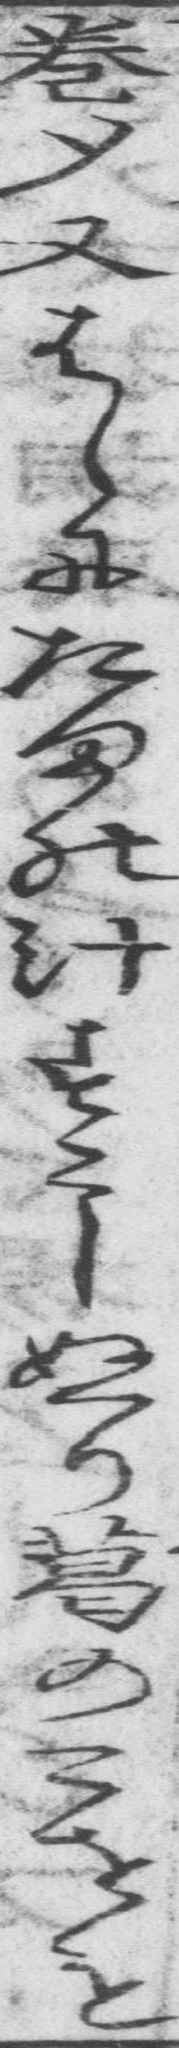巻〆。又はしに。たまの汁すこしぬり、葛のこをも
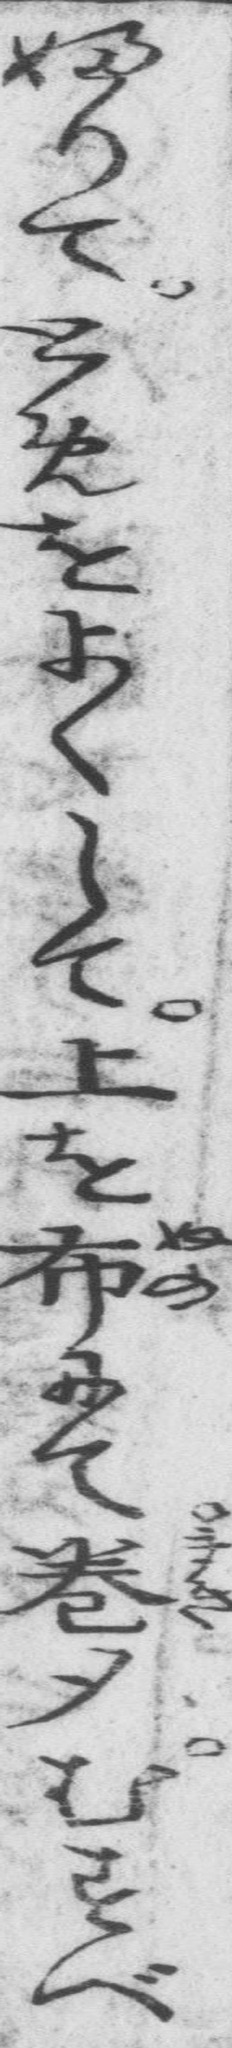ふりて。とめをよくして。上を布にて。巻〆。むすべ
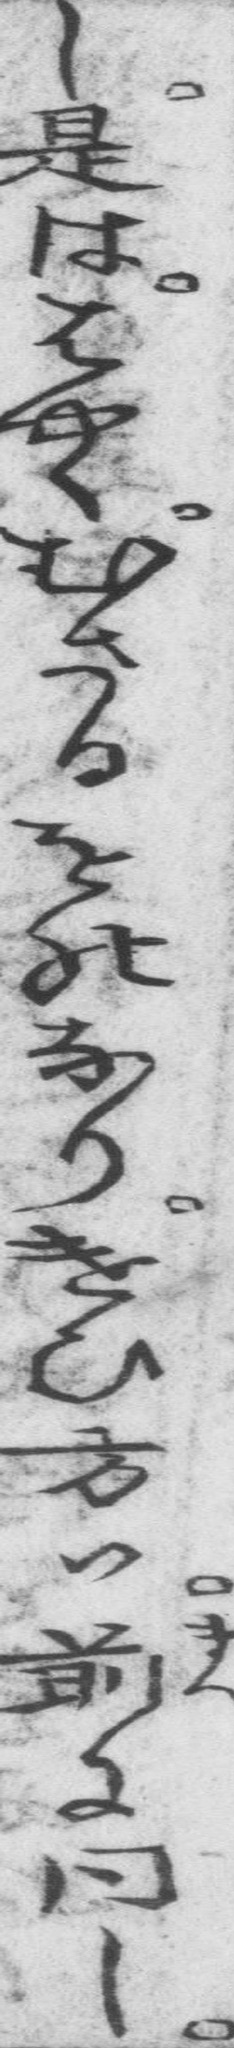し。是は。はやく。むさるものなり。遣ひ方は。前に同し。
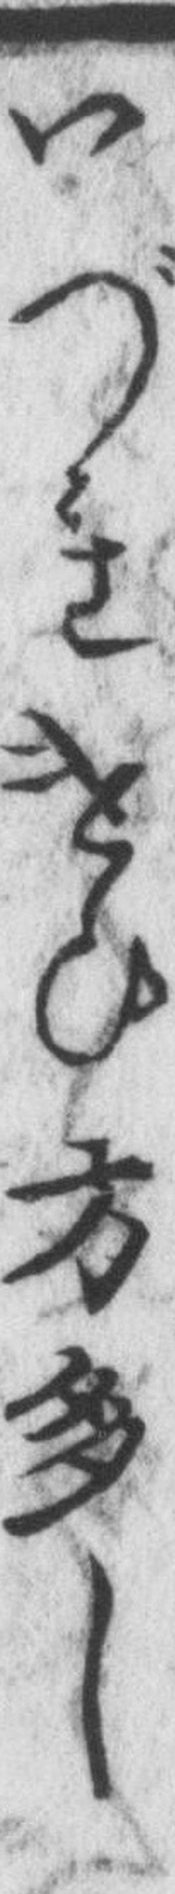いづれ遣ひ方多し
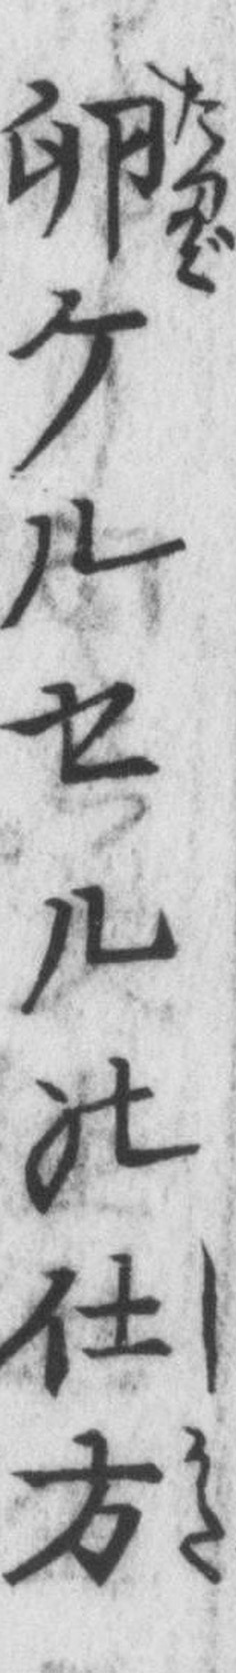卵ケルセルの仕方
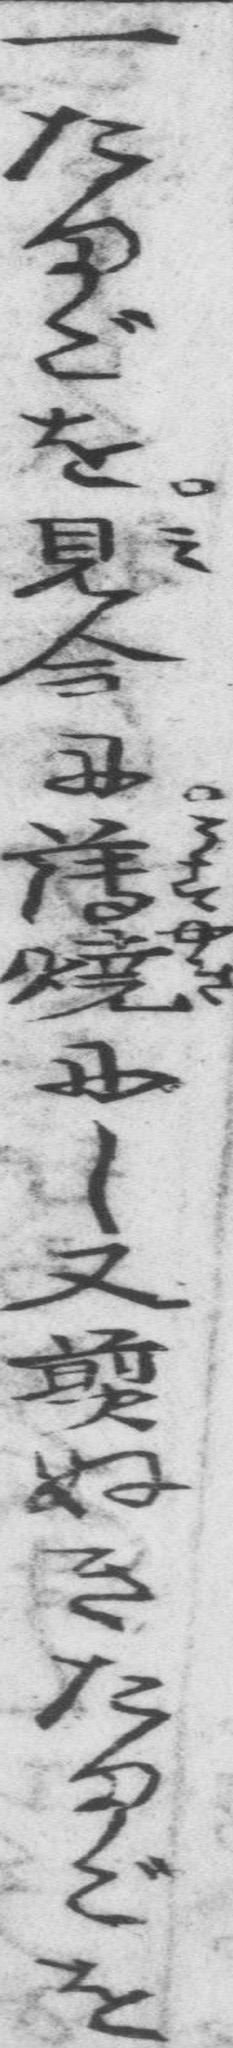一たまごを。見合に。薄焼にし又煎ぬきたまごを

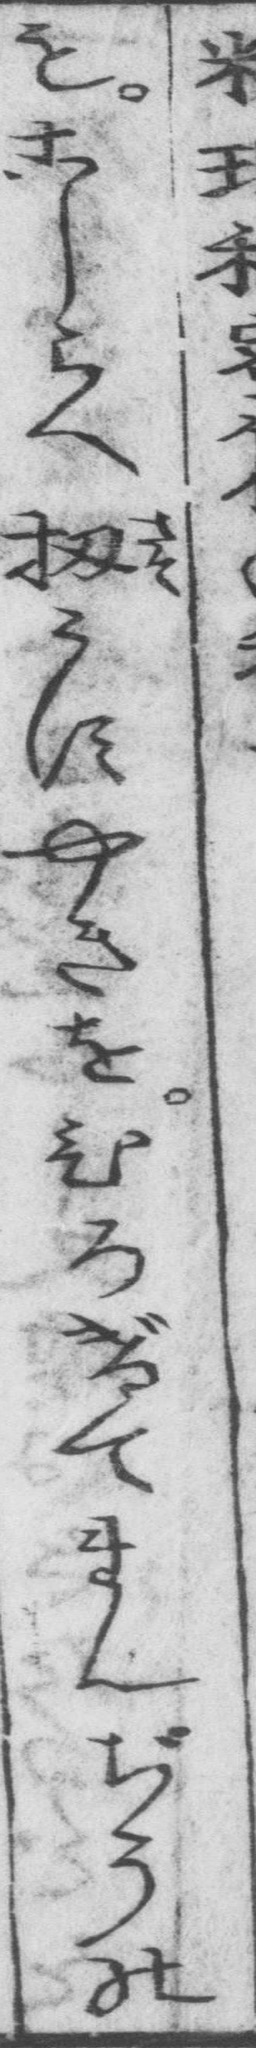も。こしらへ扨うすやきを。ひろげてまんぢうの
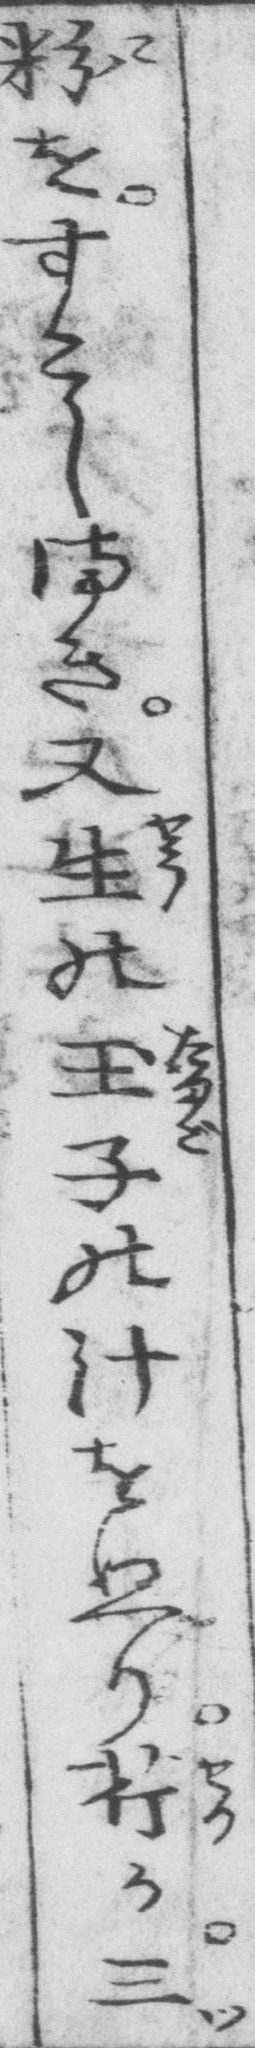粉を。すこしまき。又生の玉子の汁をぬり。芹か。三ツ
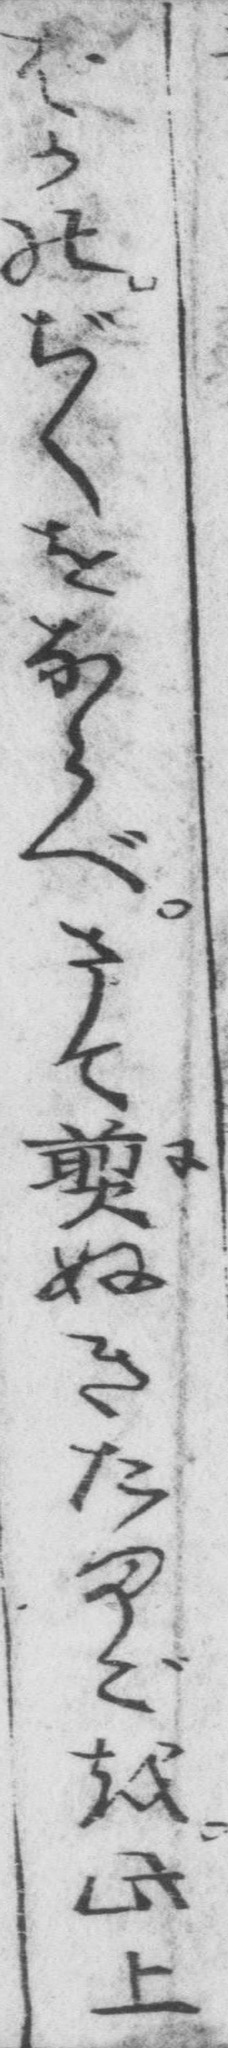ばかの。ぢくをならべ。さて煎ぬきたまごを。此上
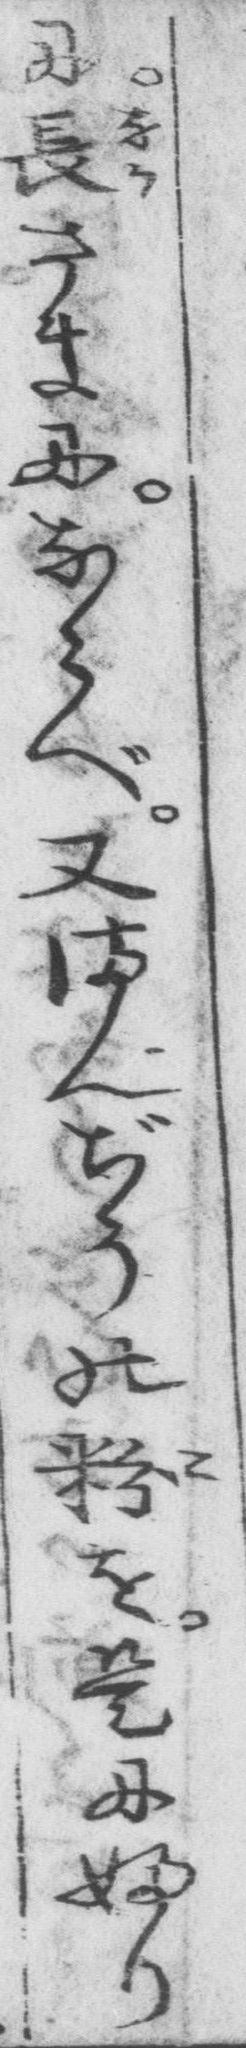に。長さまに。ならべ。又まんぢうの粉を。是にふり
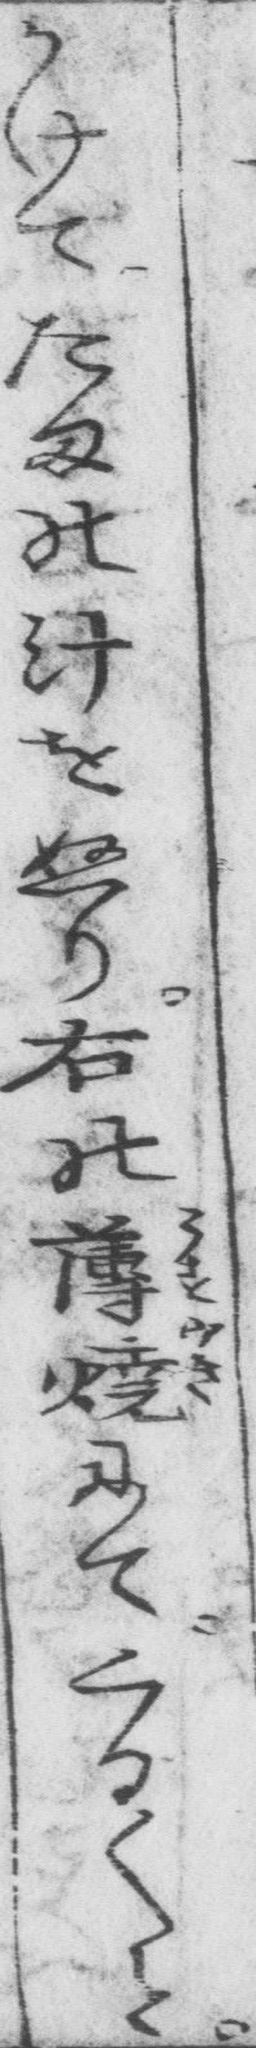かけて。たまの汁をぬり。右の薄焼にて。くる〳〵と。
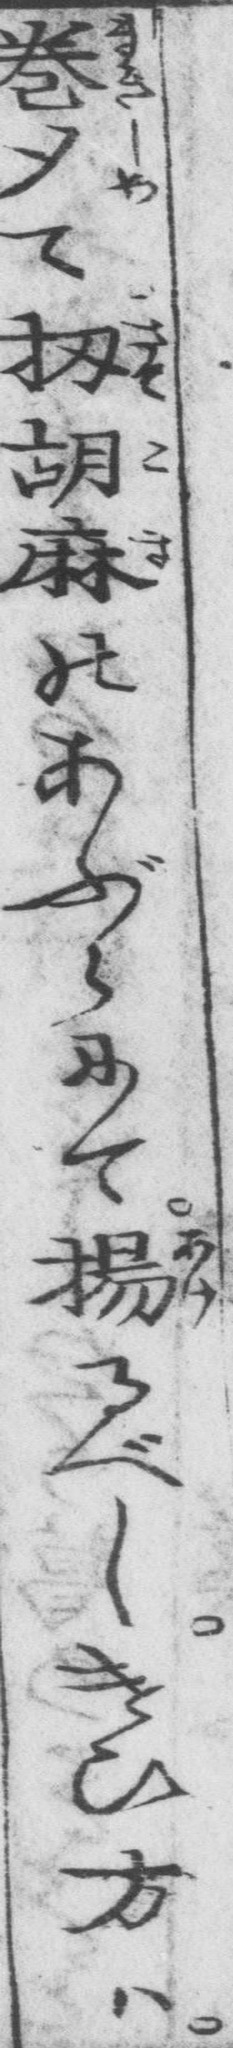巻〆て。扨胡麻のあぶらにて。揚るべし。遣ひ方は。
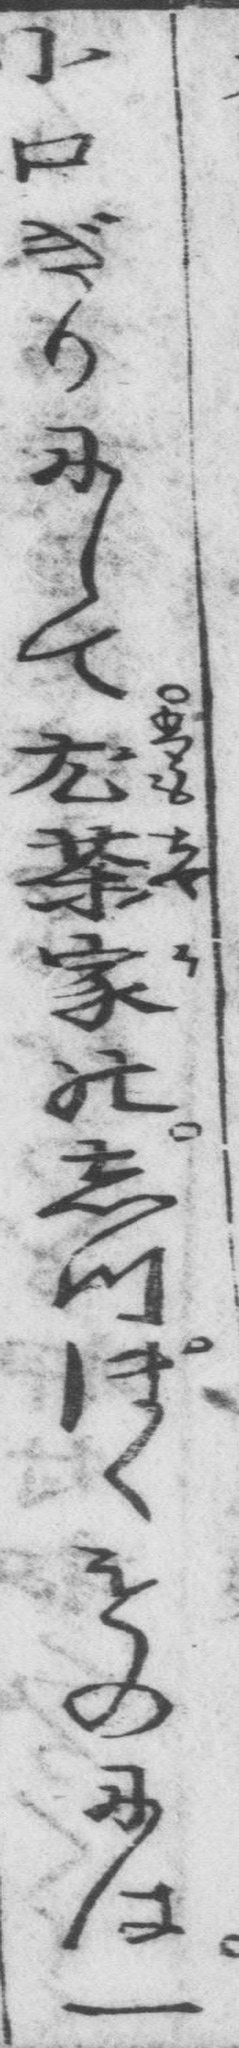小口ぎりにして。尤茶家の。しつぽくものには。一
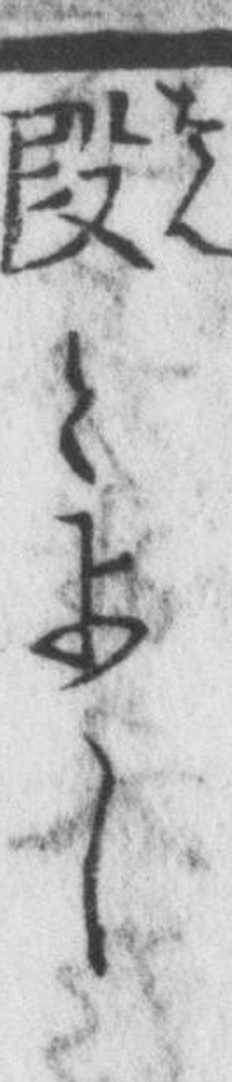段とよし
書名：萬寳料理秘密箱
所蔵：大阪府立大学学術情報センター 国文学研究資料館
